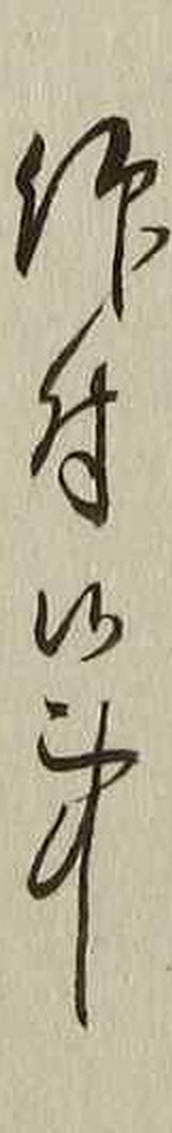仰付候事
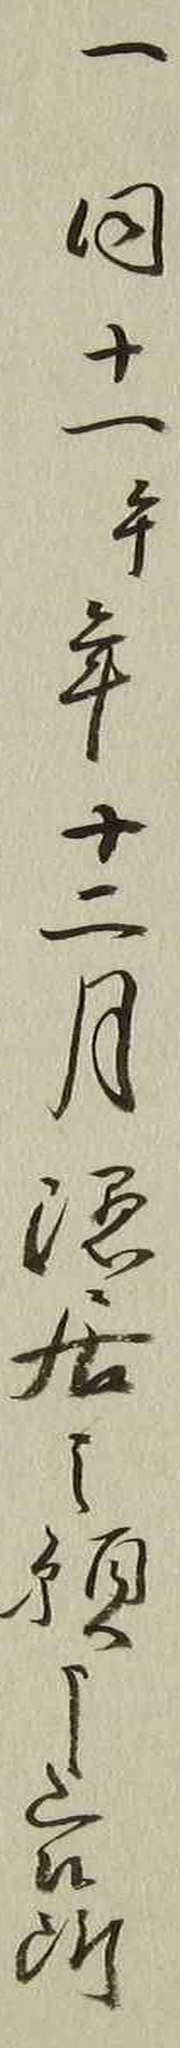一同十一午年十二月隠居之願申上候所
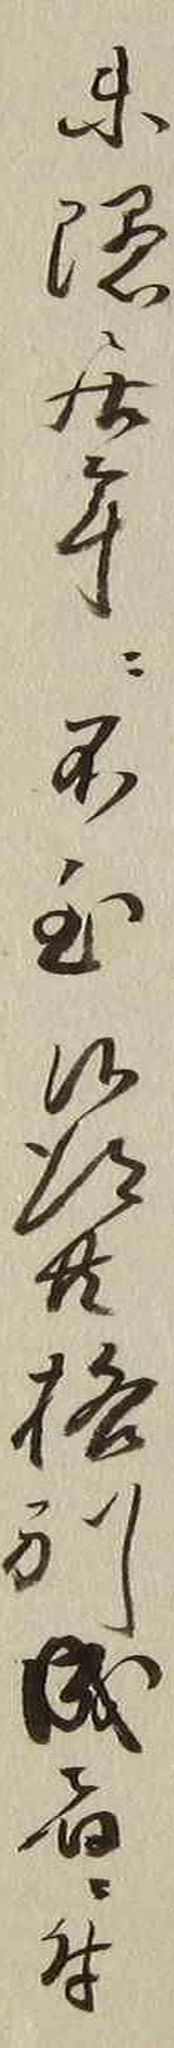未隠居年ニ不至候得共格別成者ニ付
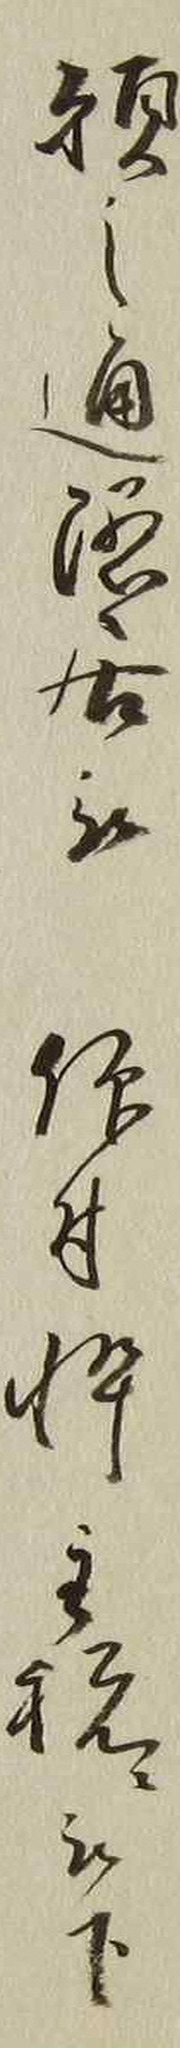願之通隠居被仰付忰主祝ニ被下
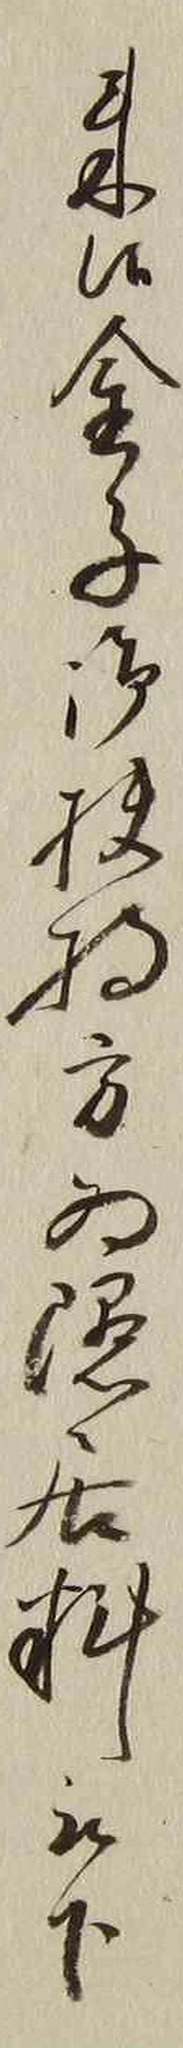成候金子御扶持方為隠居料被下
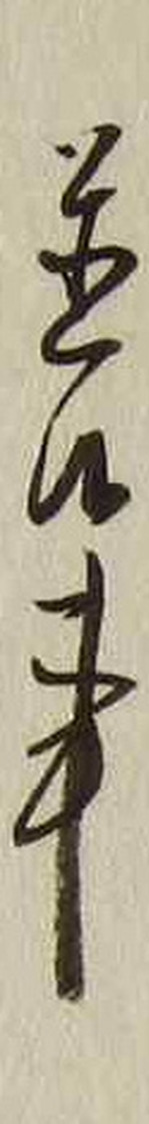置候事
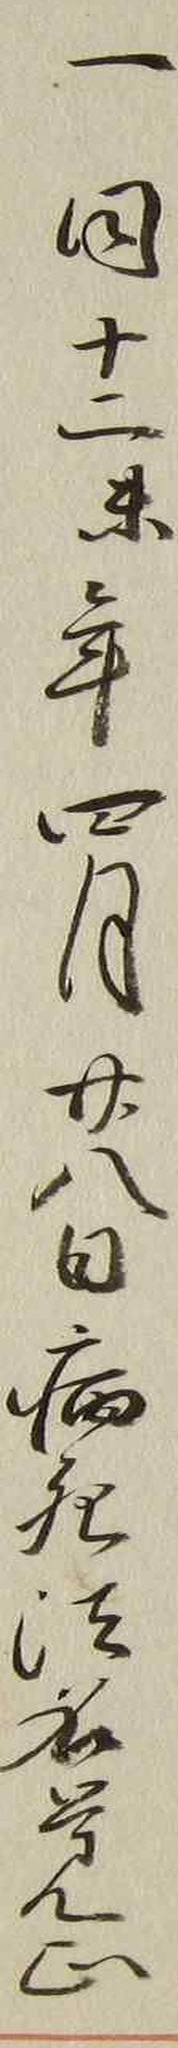一同十二未年四月廿八日病死法名覚正
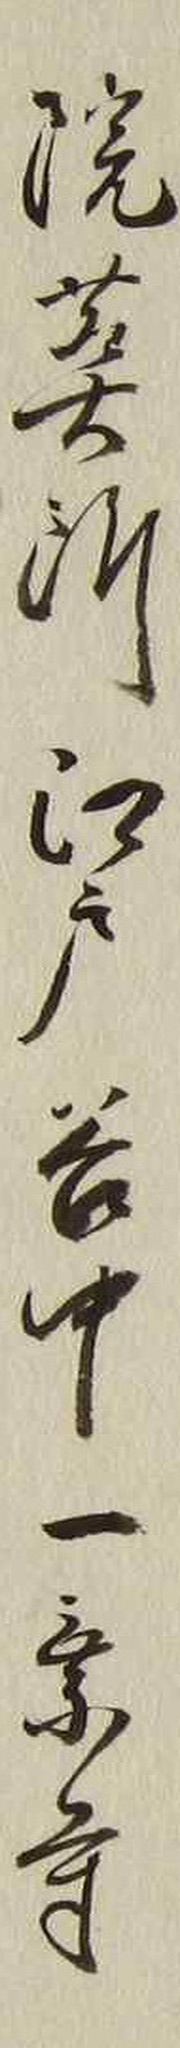院葬所江戸谷中一乗寺
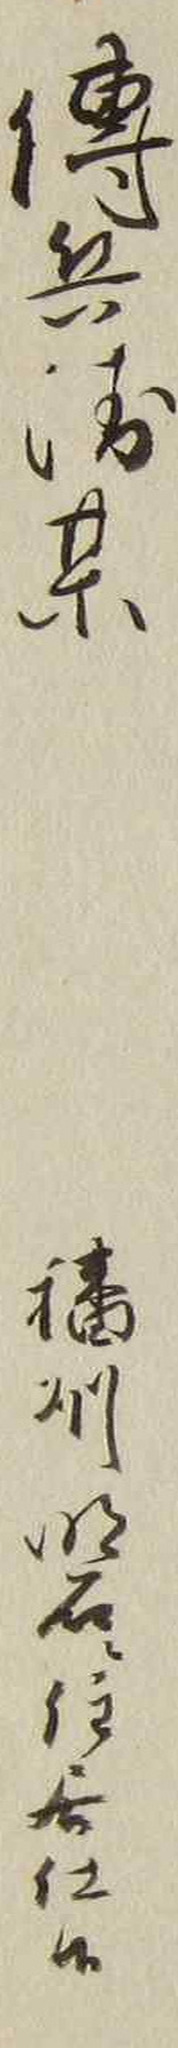伝兵衛某播州明石ニ居住仕候

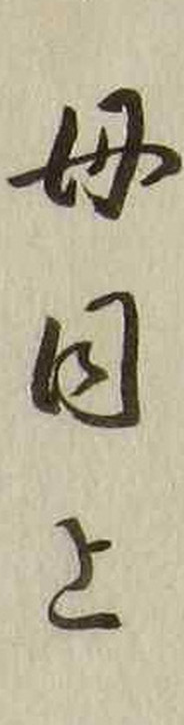母同上
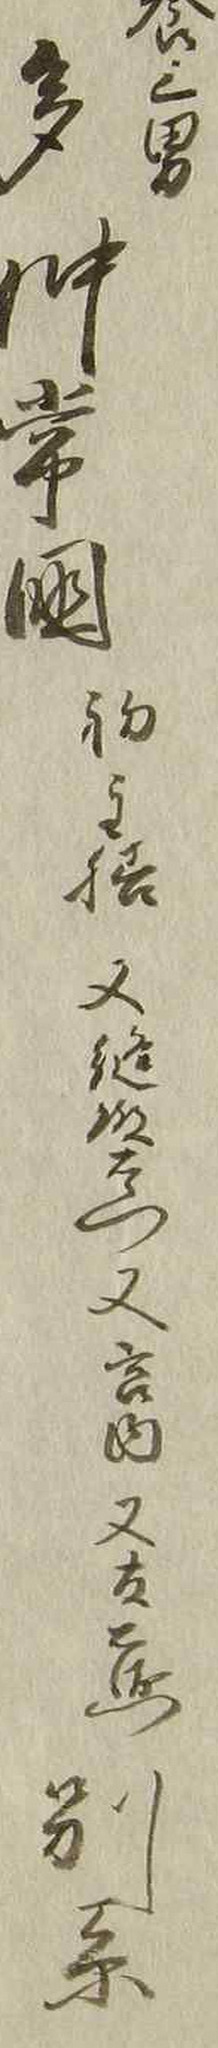多仲常国初主膳又縫殿右衛門又宮内又友右衛門別糸
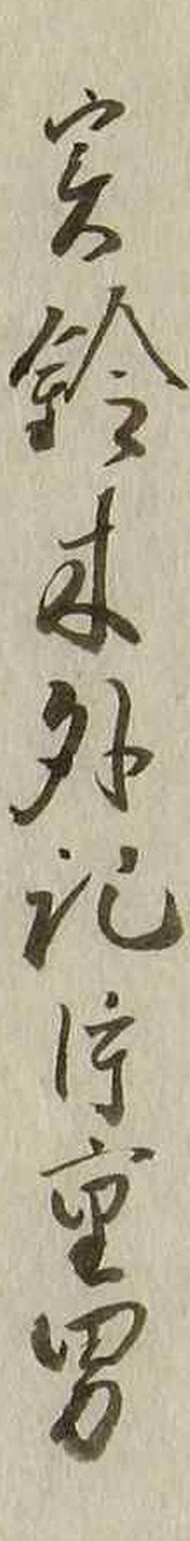実鈴木外記片重男
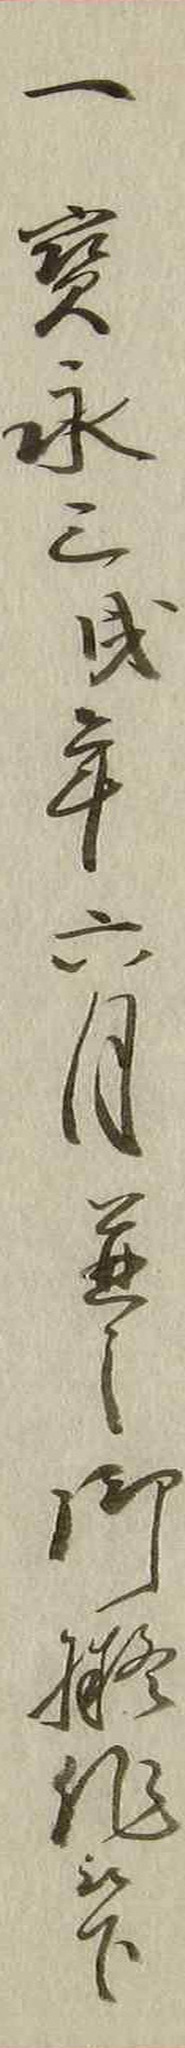一宝永三戌年六月並之御擬作被下
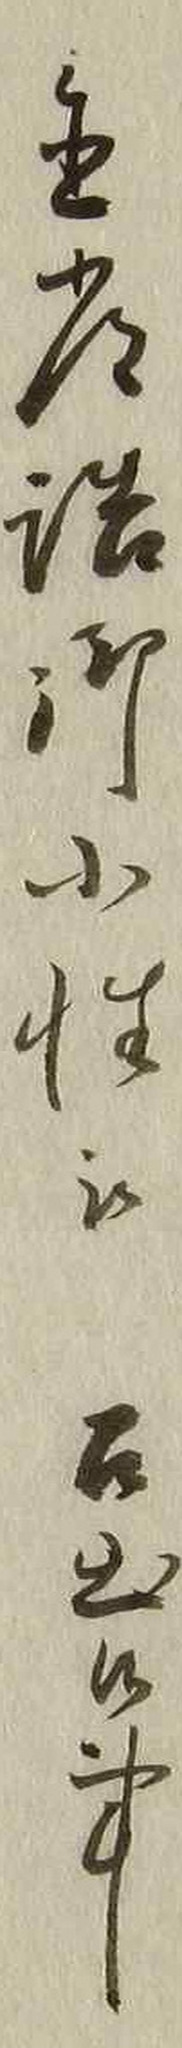置常詰御小性被召出候事
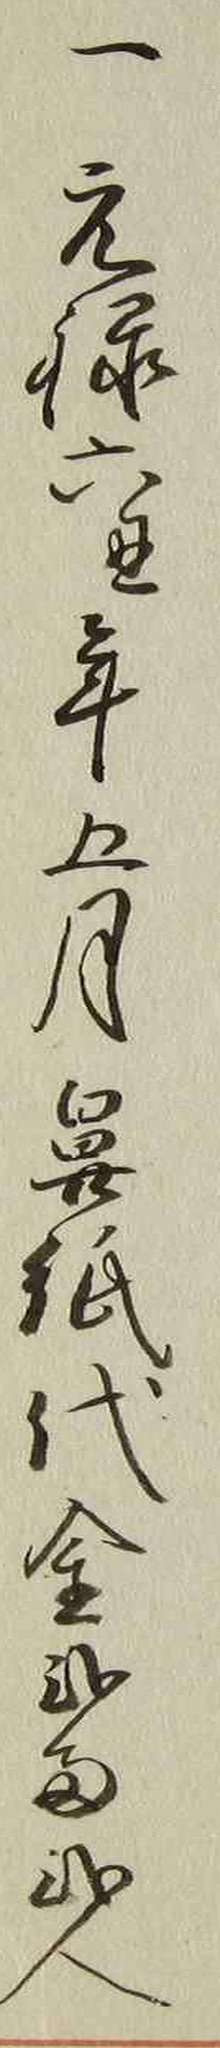一元禄六丑年五月鼻紙代金弐両弐人
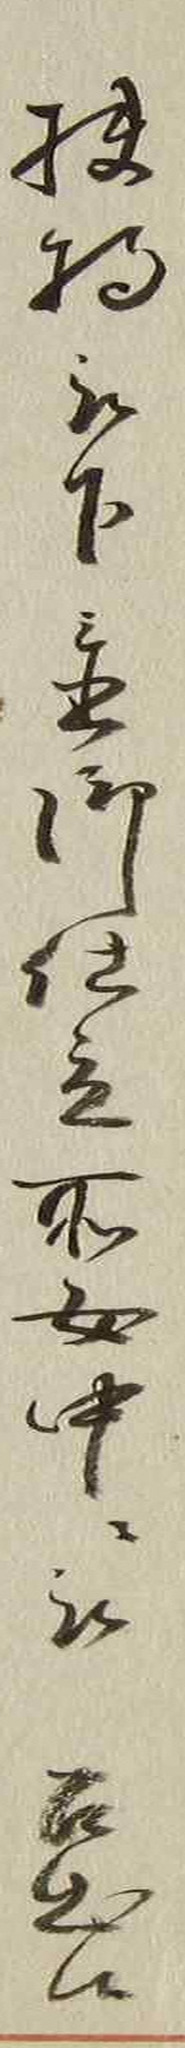扶持被下置御仕立所女中ニ被召出候
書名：諸士系譜　巻之122　よ之部5
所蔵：会津若松市立会津図書館
